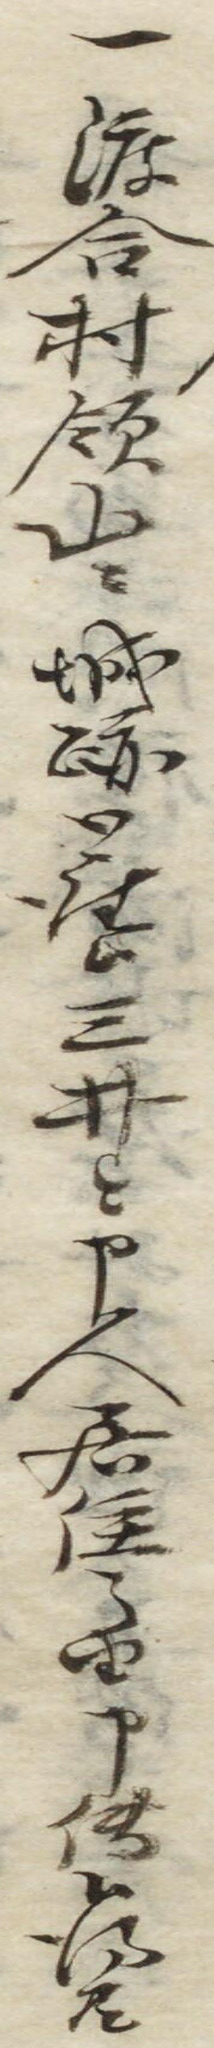一渡合村領山に城跡御座候三井と申人居住之由申伝候得共
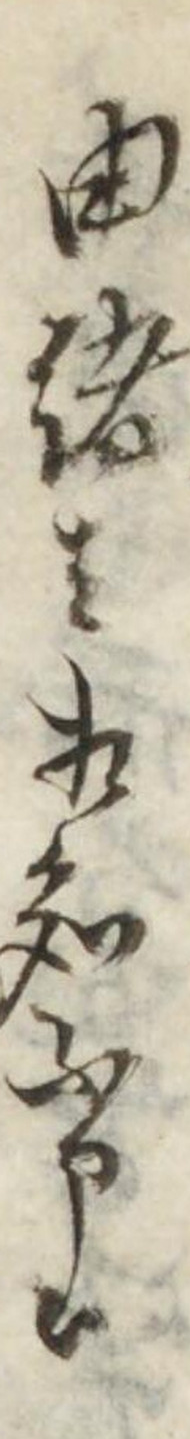由緒は相知不申候
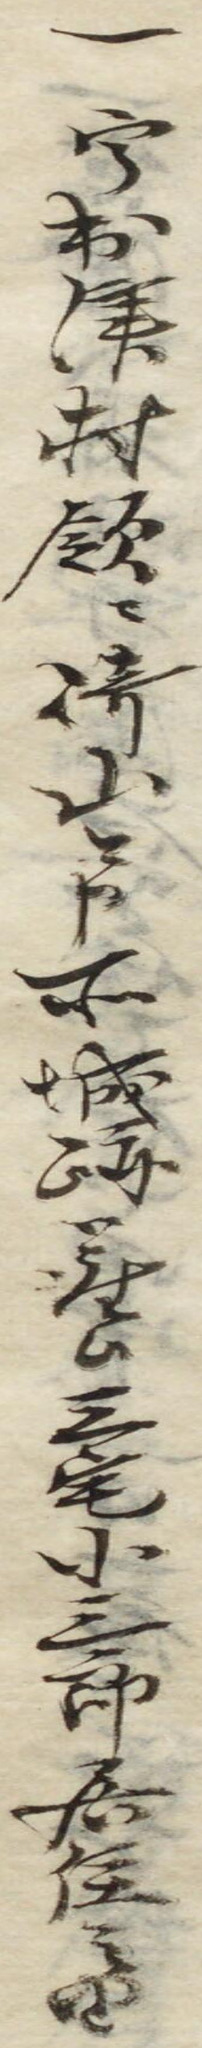一宇出津村領に崎山と申所城跡御座候三宅小三郎居住之由
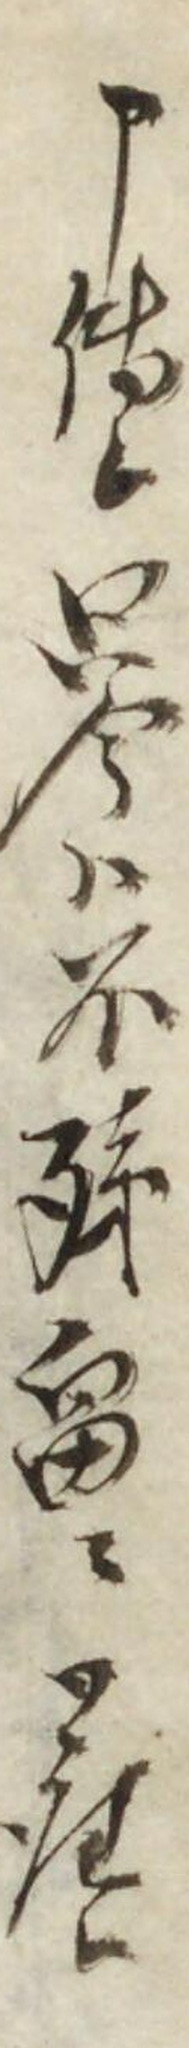申伝候只今は不残畠に御座候
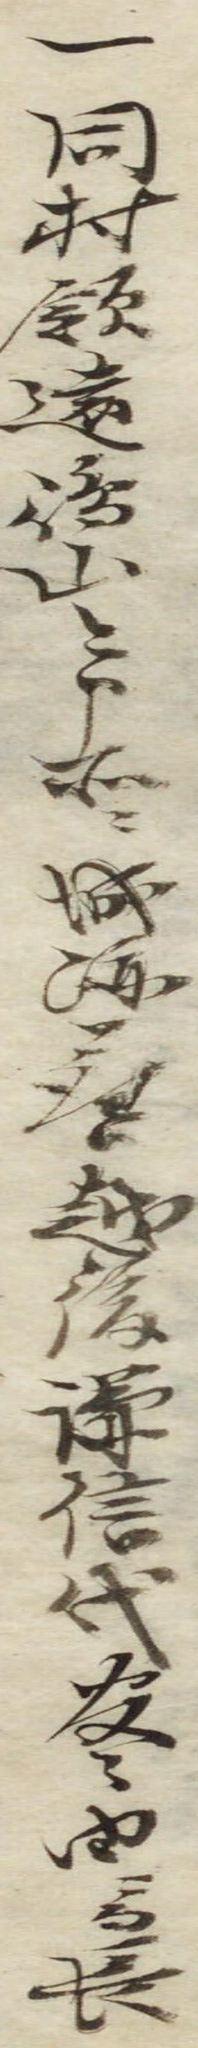一同村領遠嶋山と申所に城跡御座候越後謙信代官之由に而長
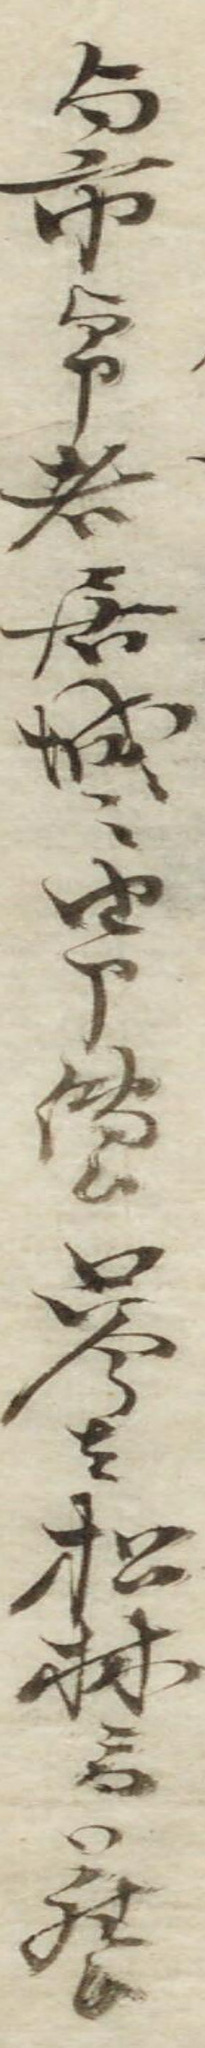与市与申者居城之由申伝候只今は松林に而御座候
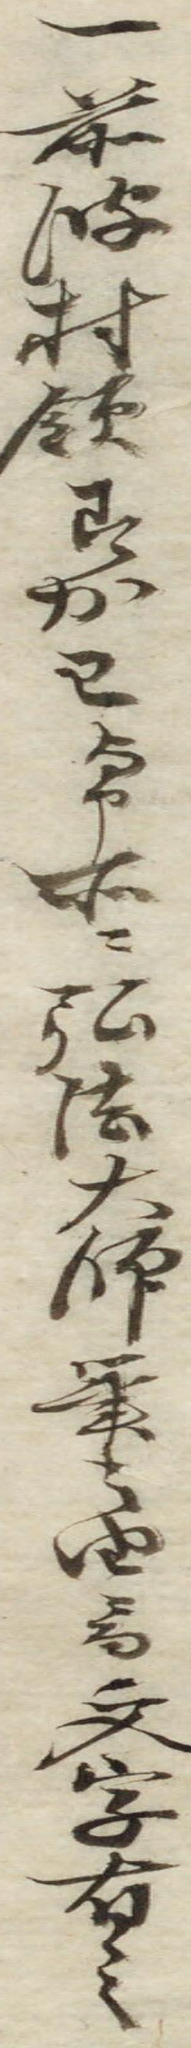一前波村領すかわ与申所に弘法大師筆之由に而文字有之
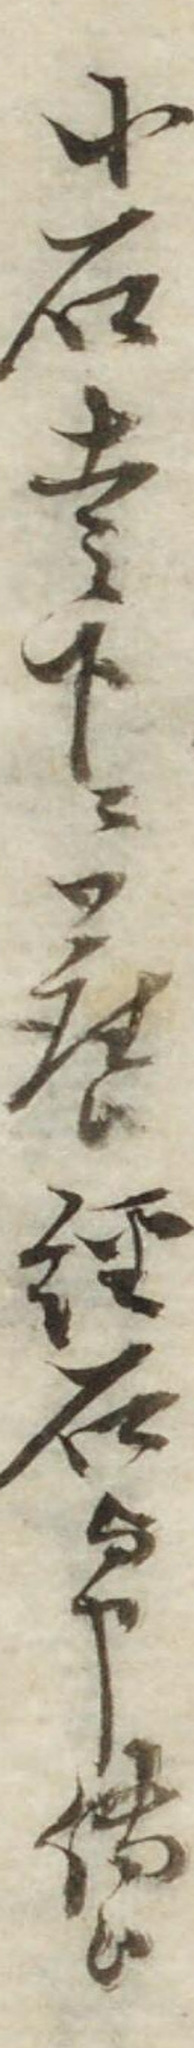小石土之下に御座候経石与申伝候
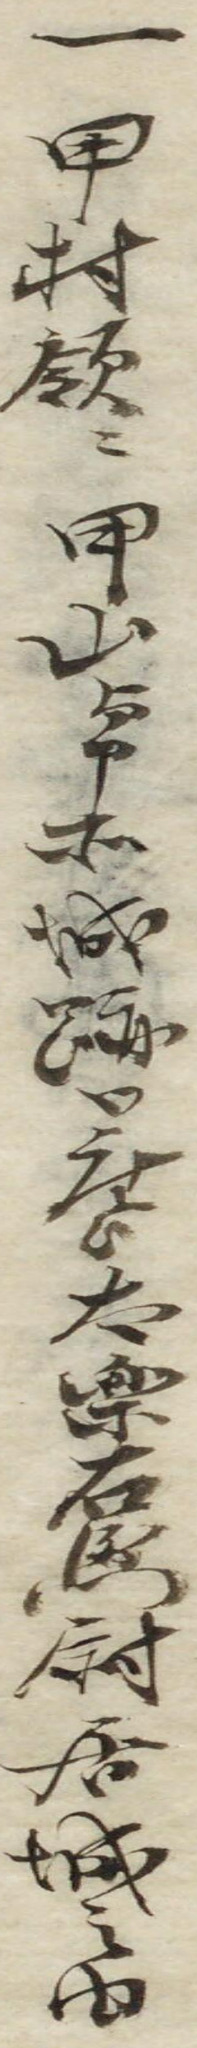一甲村領に甲山与申所城跡御座候太楽右衛門尉居城之由
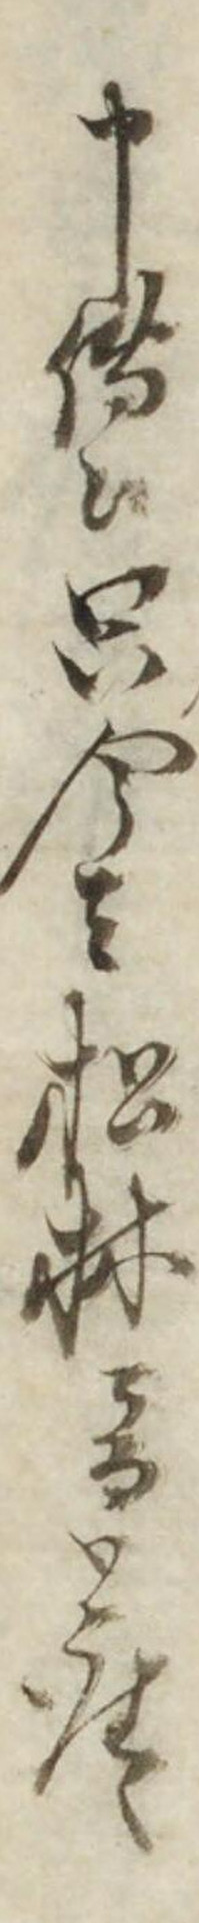申伝候只今は松林に而御座候
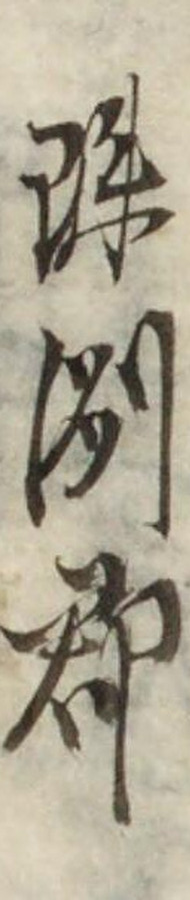珠洲郡
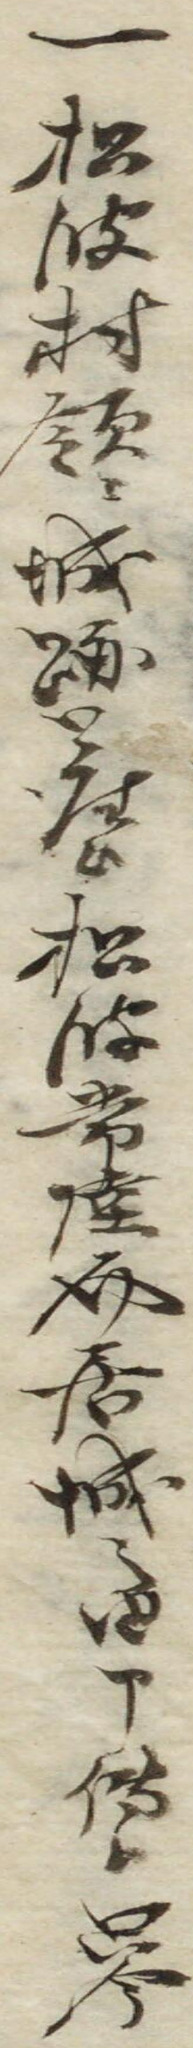一松波村領に城跡御座候松波常陸介居城之由申伝候只今
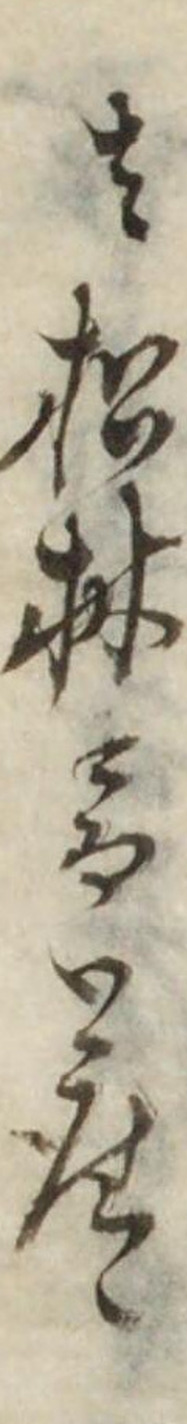は松林に而御座候
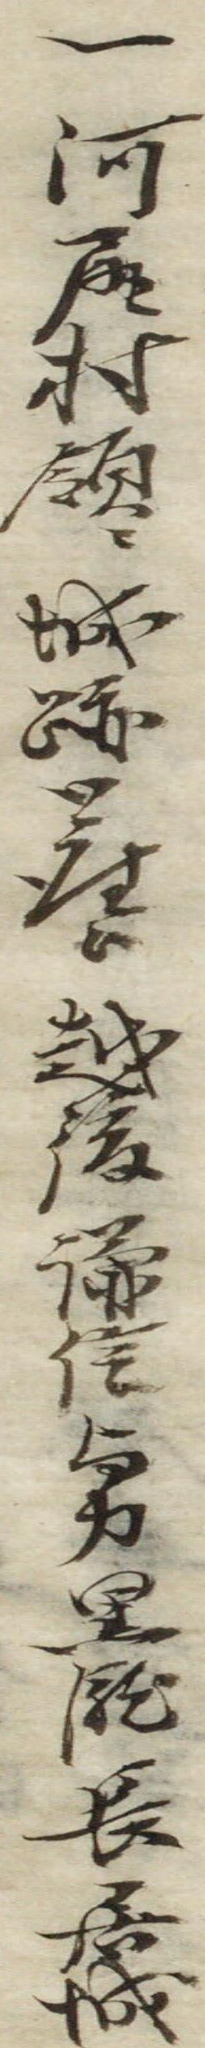一河尻村領に城跡御座候越後謙信与力黒瀧長居城
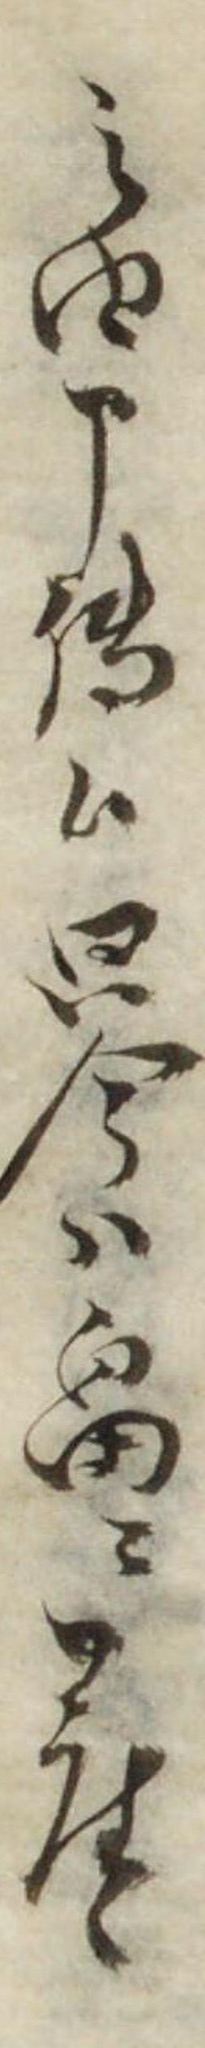之由申伝候只今は畠に御座候
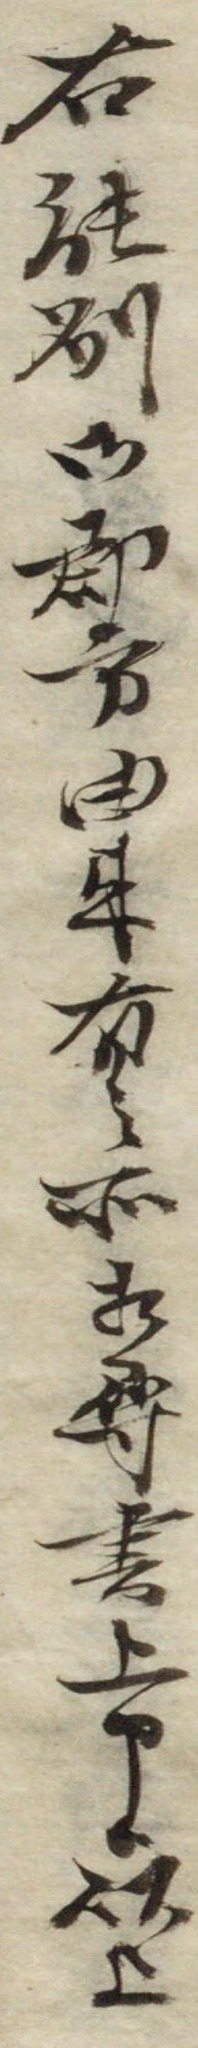右能州御郡方由来有之所相尋書上申候以上
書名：加越能旧聞録
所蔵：Ishikawa Prefectural Library
